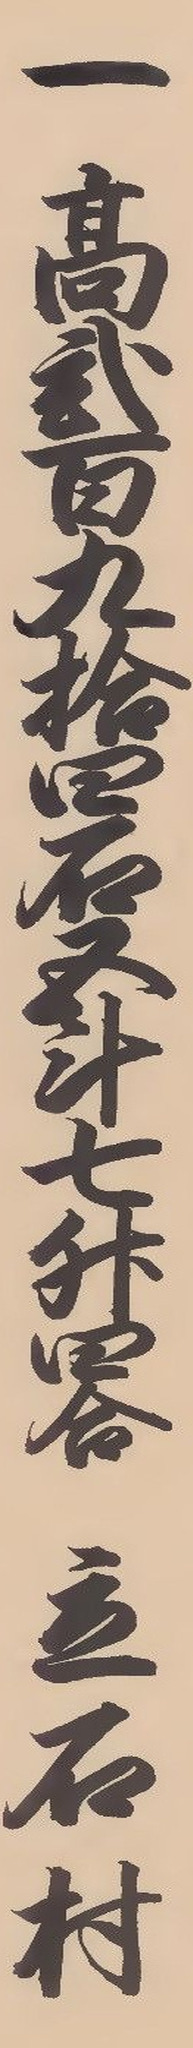一高弐百九拾四石五斗七升四合立石村
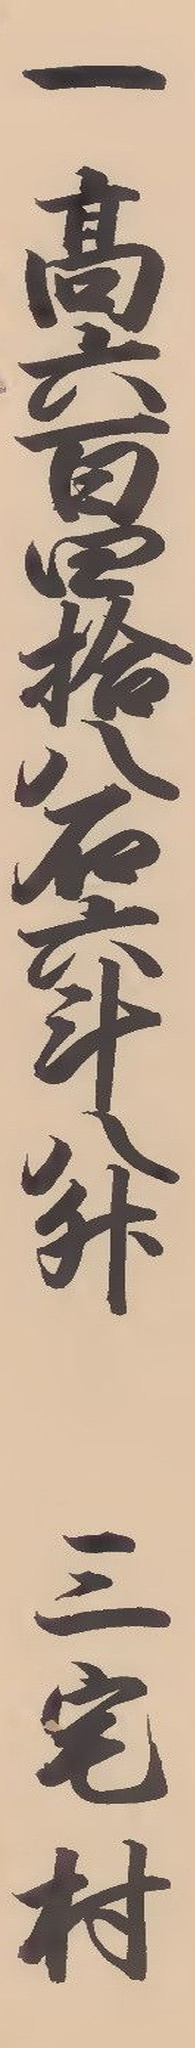一高六百四拾八石六斗八升三宅村

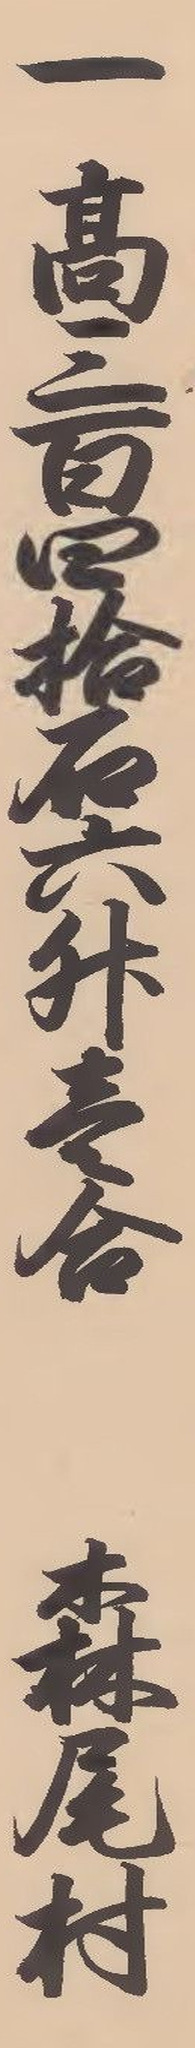一高三百四拾石六升壱合森尾村
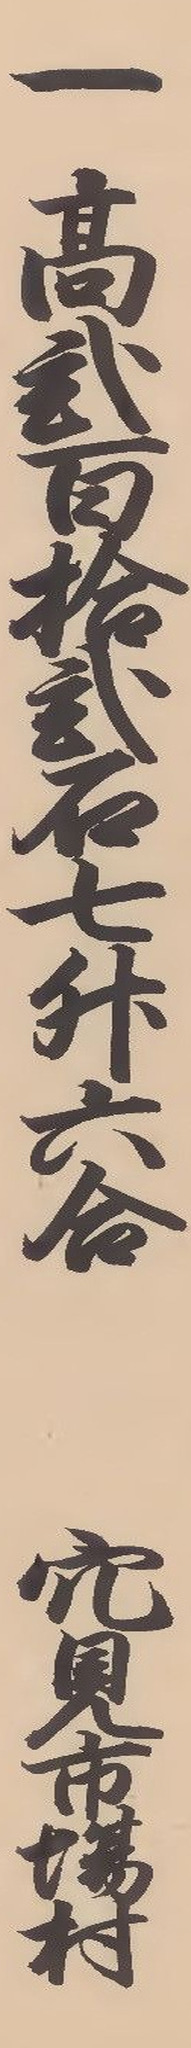一高弐百拾弐石七升六合穴見市場村
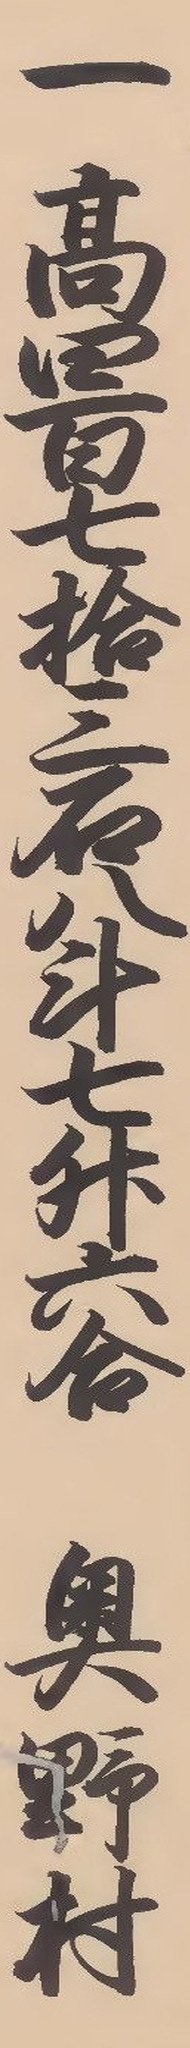一高四百七拾三石八斗七升六合奥野村
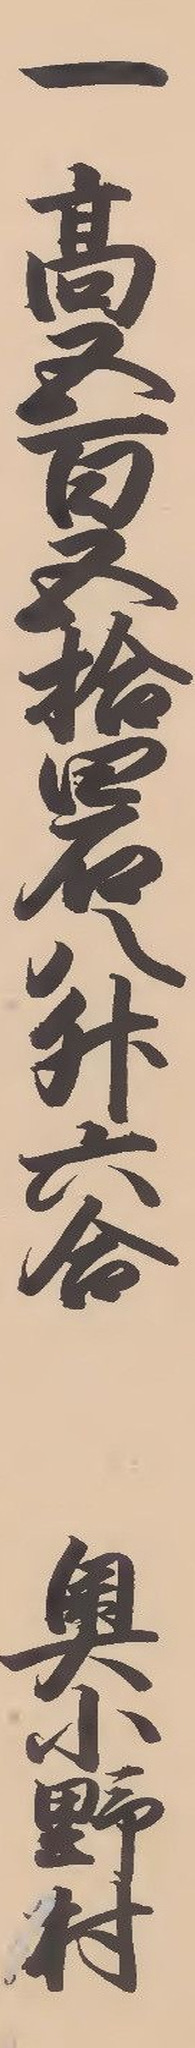一高五百五拾四石八升六合奥小野村
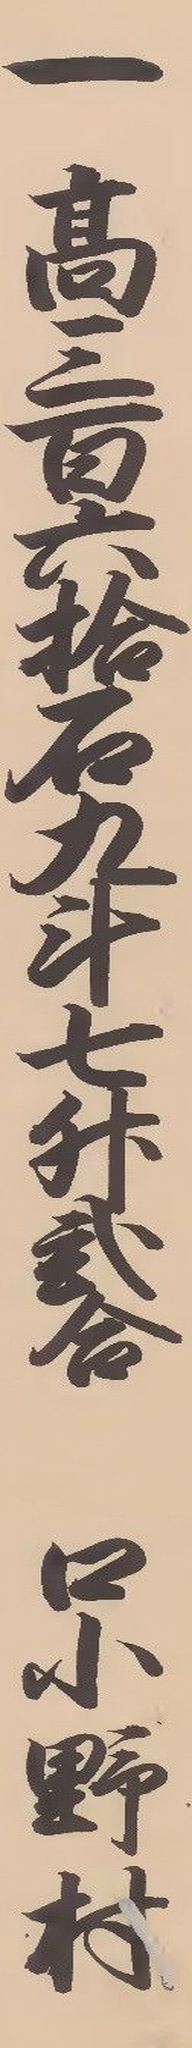一高三百六拾石九斗七升弐合口小野村
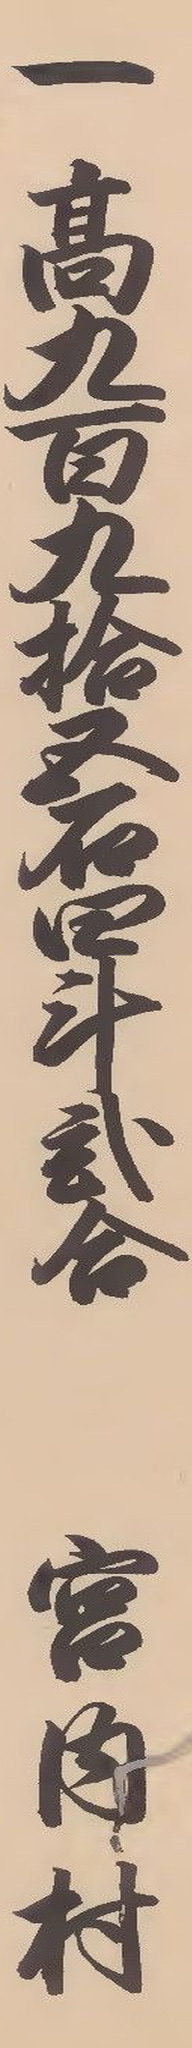一高九百九拾五石四斗弐合宮内村
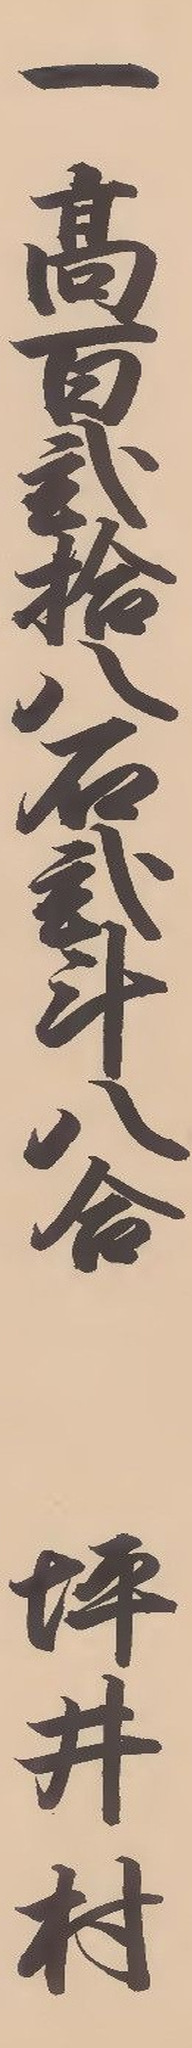一高百弐拾八石弐斗八合坪井村
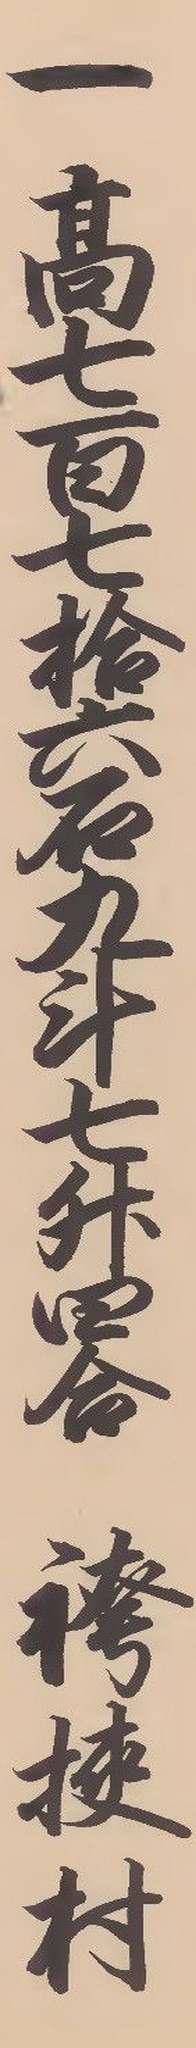一高七百七拾六石九斗七升四合袴挾村

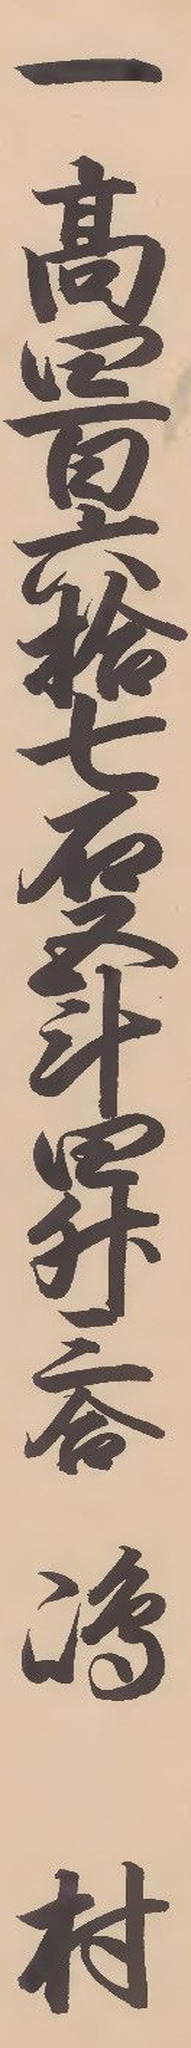一高四百六拾七石五斗四升三合嶋村
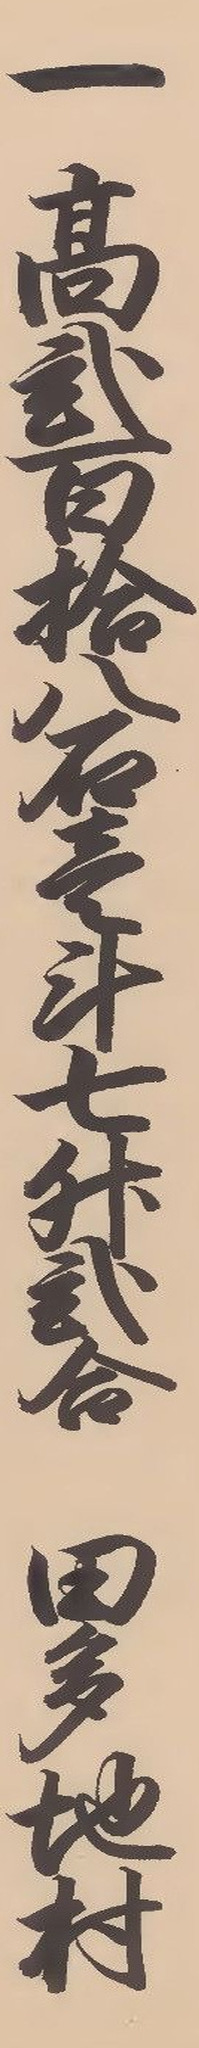一高弐百拾八石壱斗七升弐合田多地村
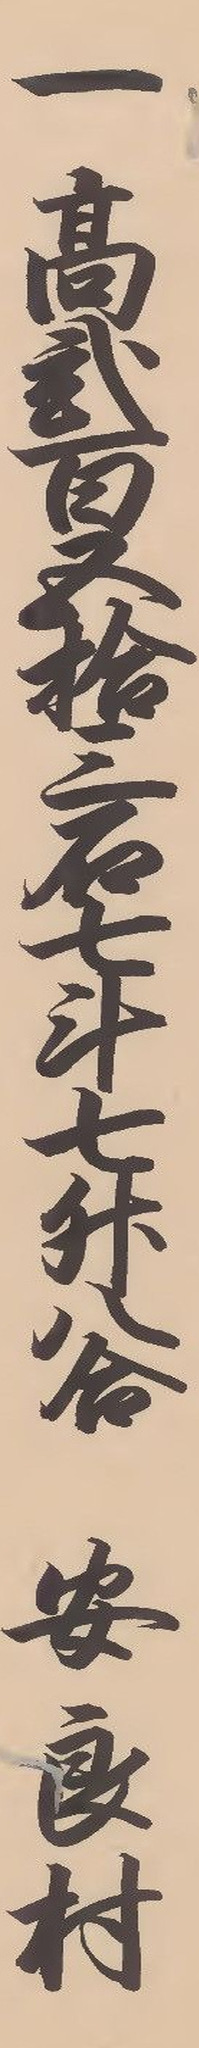一高弐百五拾三石七斗七升八合安良村
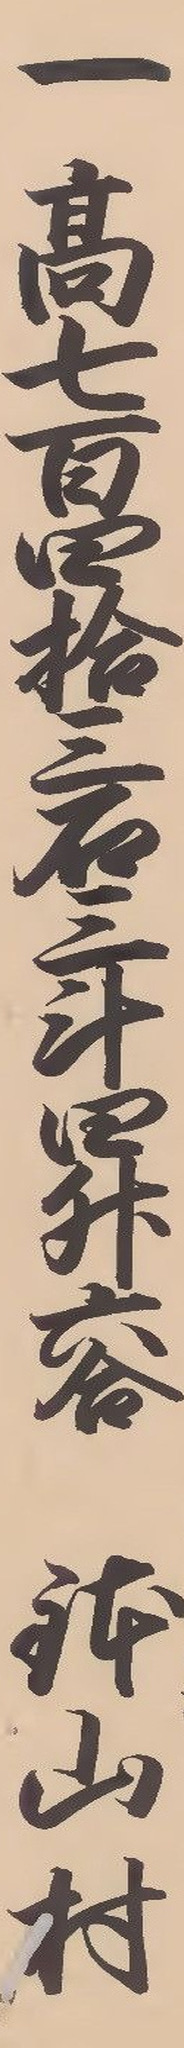一高七百四拾三石三斗四升六合鉢山村
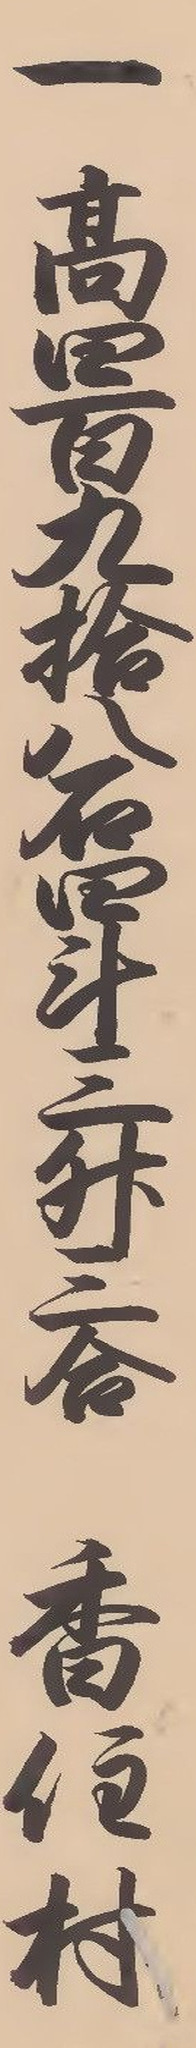一高四百九拾八石四斗三升三合香住村
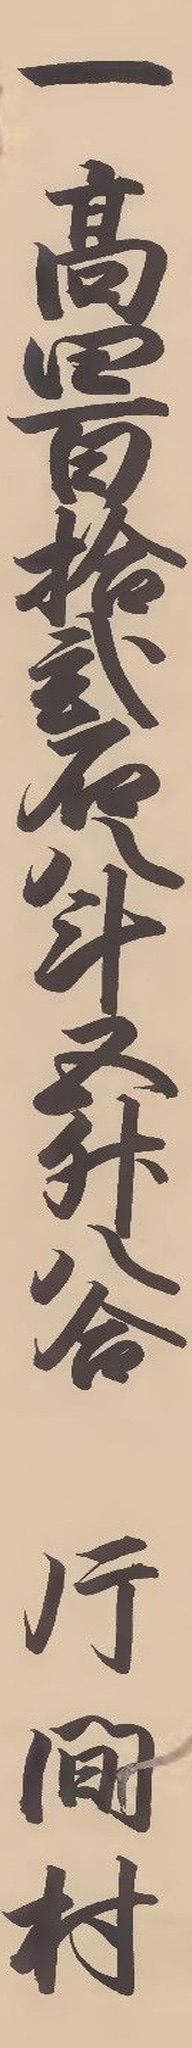一高四百拾弐石八斗五升八合片間村
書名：但馬国郷帳
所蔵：国立公文書館 National Archives of Japan
